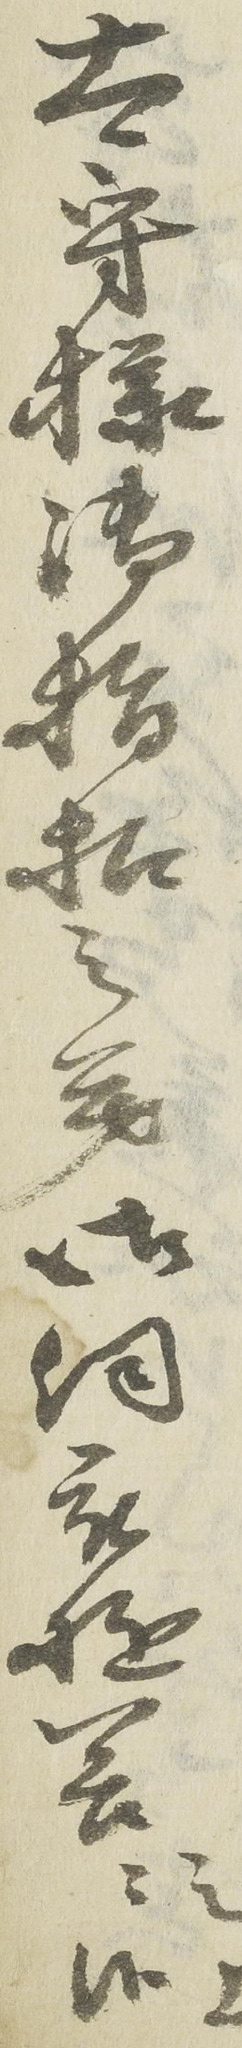太守様御指扣之義御伺被遊筈ニ候

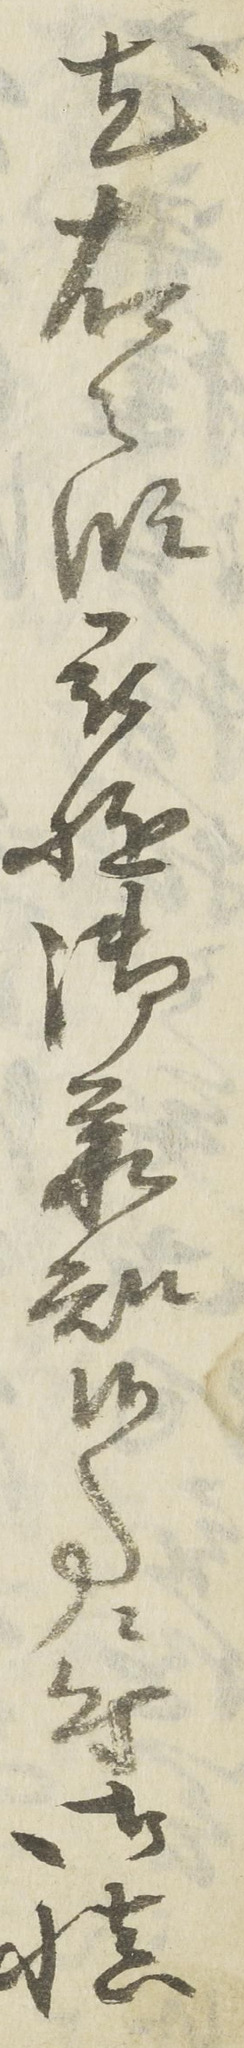尤右之段被遊御承知候事ニ付御慎
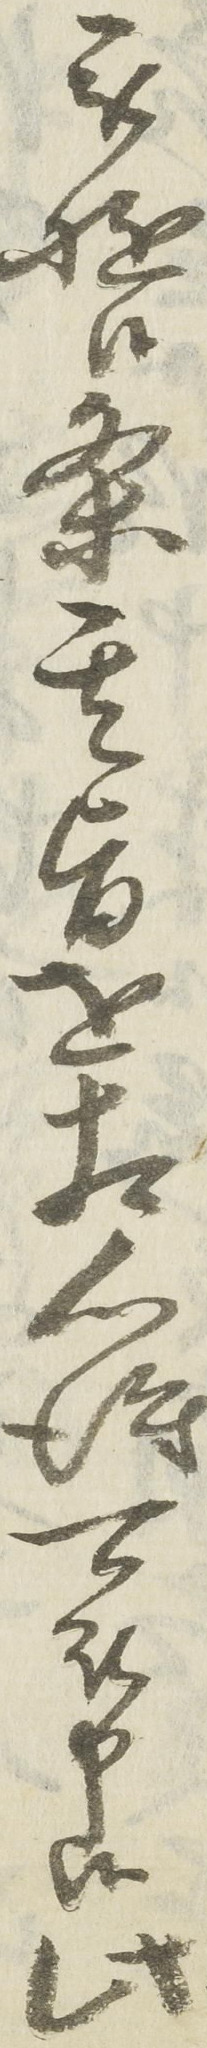被遊候条其旨を相心得可被申候此
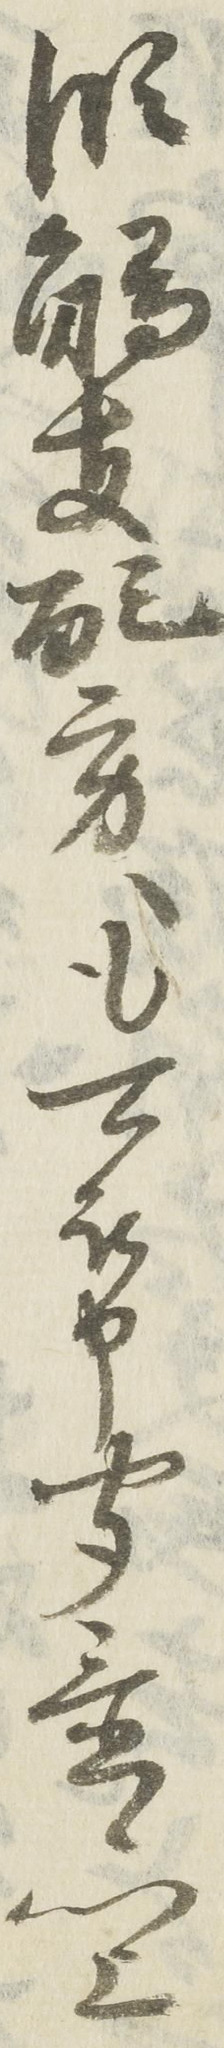段触支配方へも可被申聞置候以上
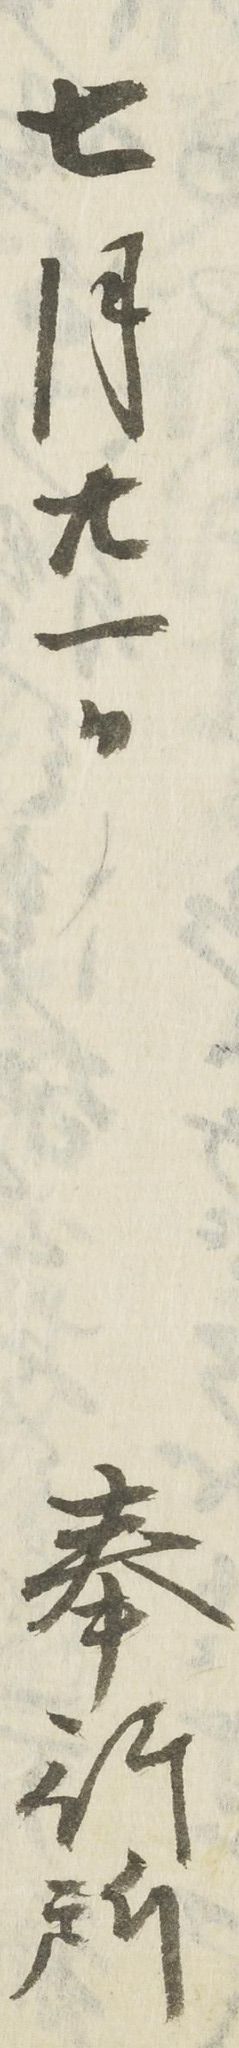七月廿一日奉行所
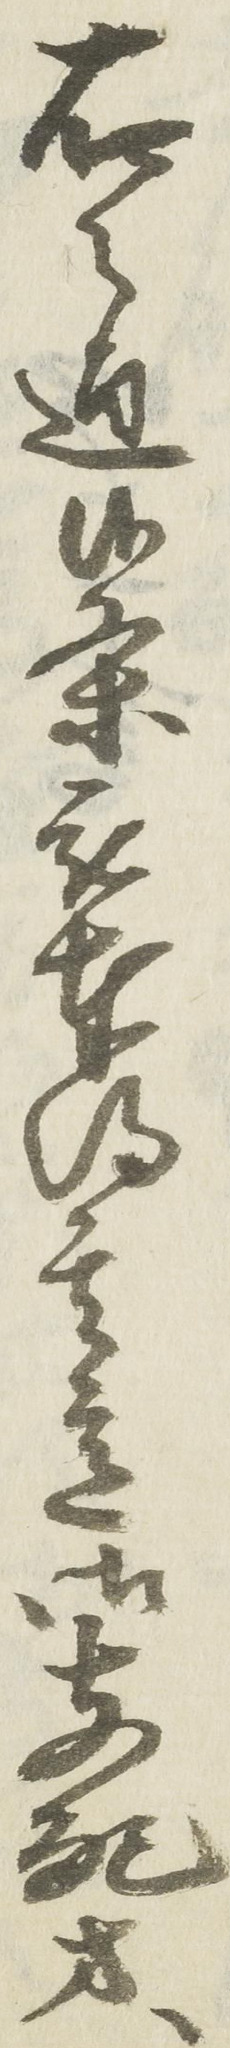右之通候条被奉得其意御支配方へ
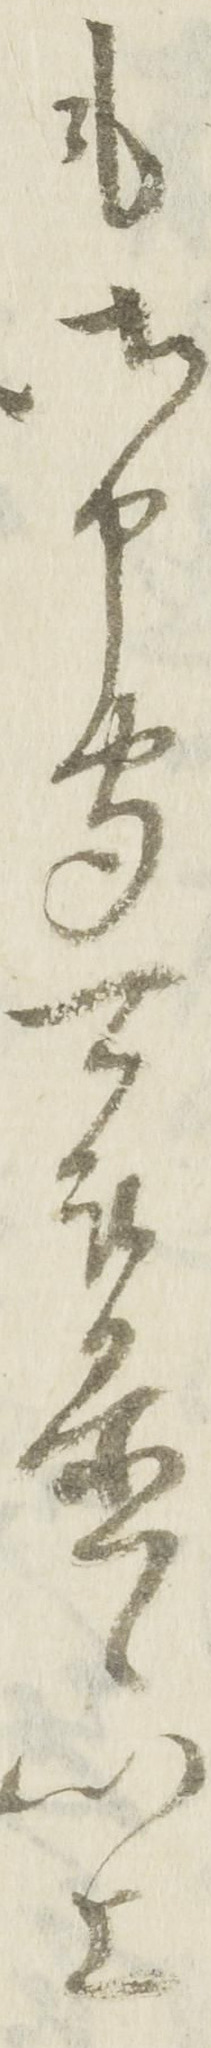も御申聞可被置置候以上
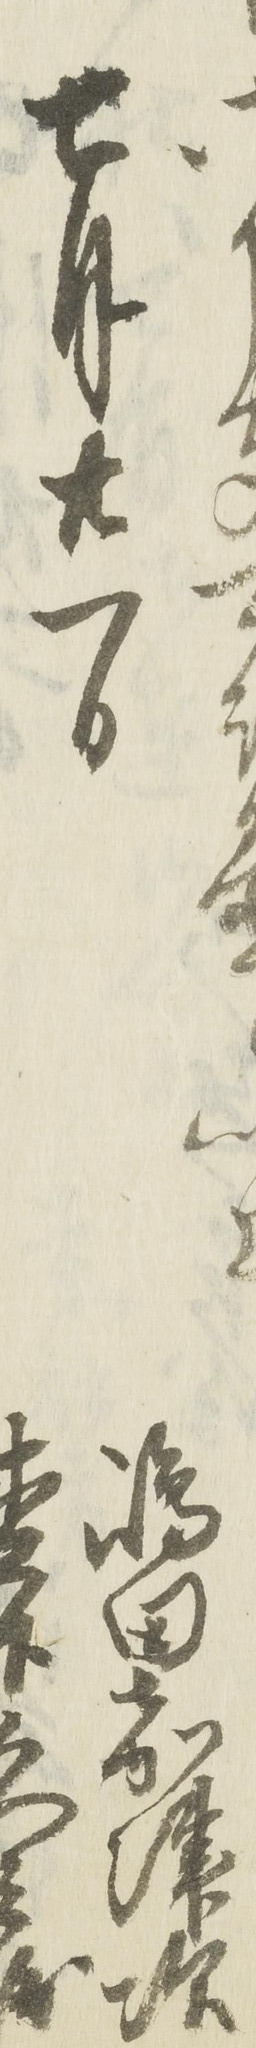七月廿一日嶋田嘉津次
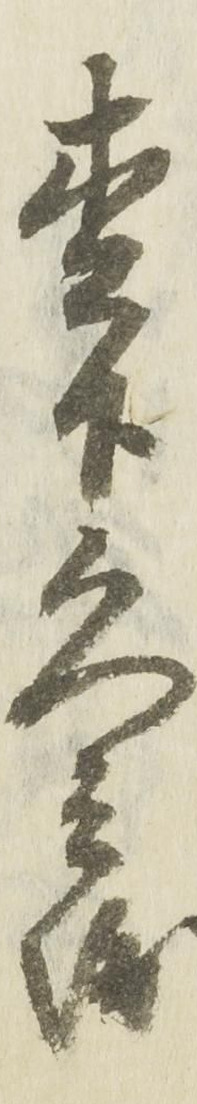松下九兵衛
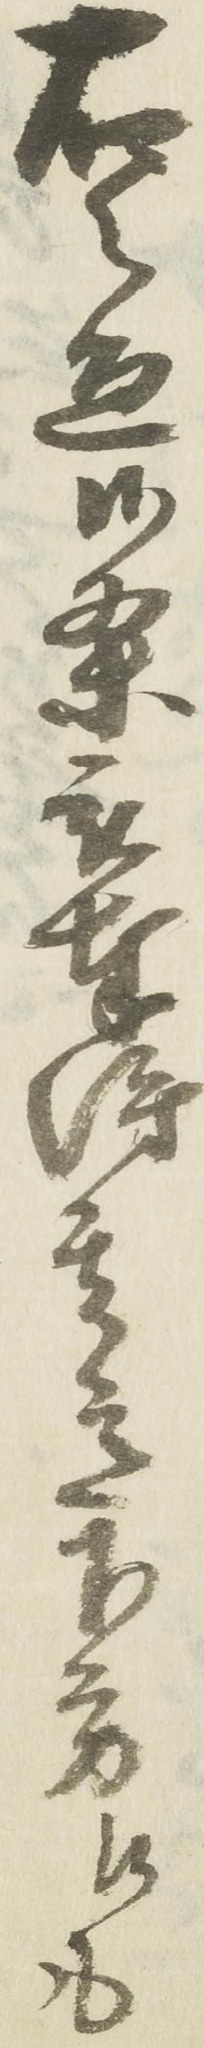右之通候条被奉得其意下方江も
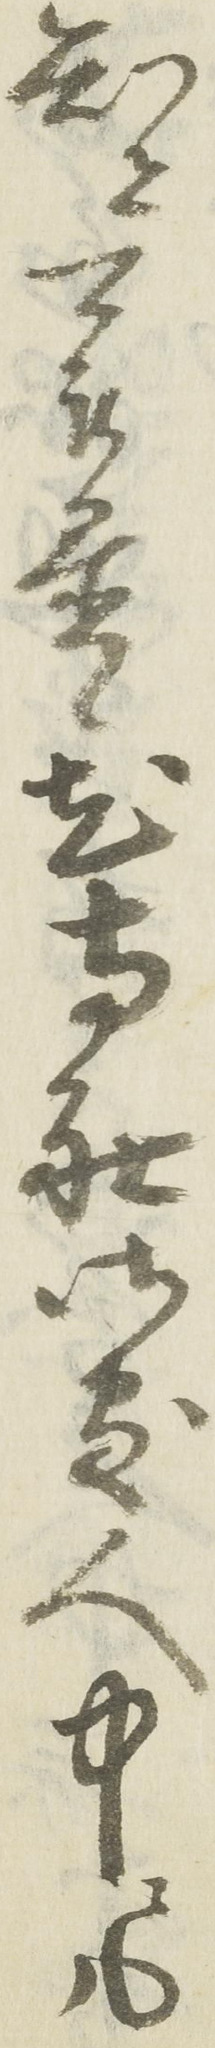知を可被置候尤寺社御家人中ニも
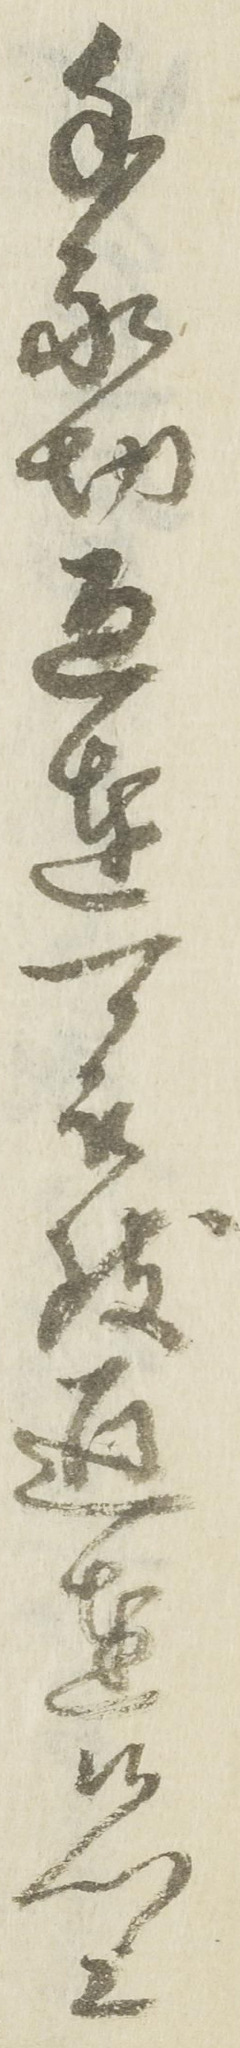手永切通達可被致通達候以上
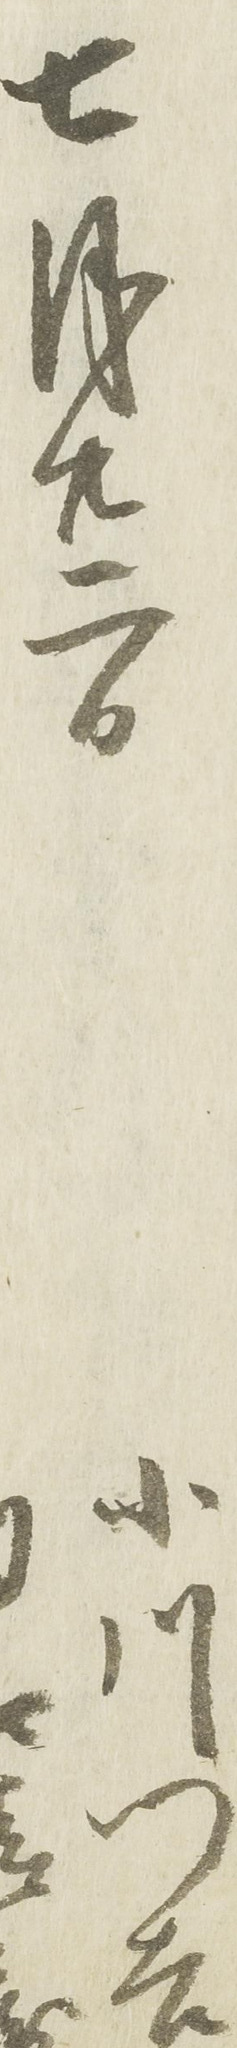七月廿二日小川門吉
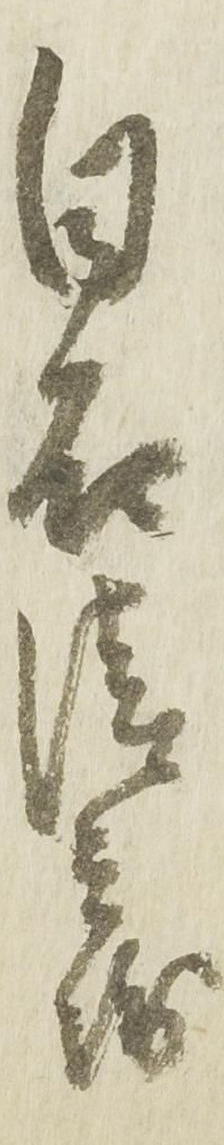白石清兵衛
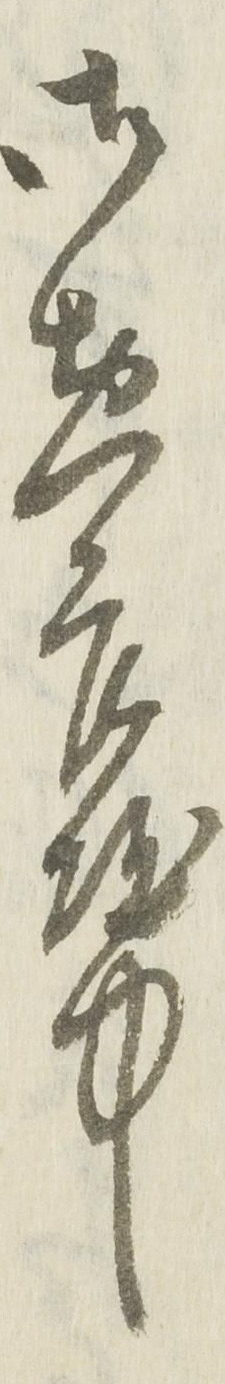御惣庄屋中
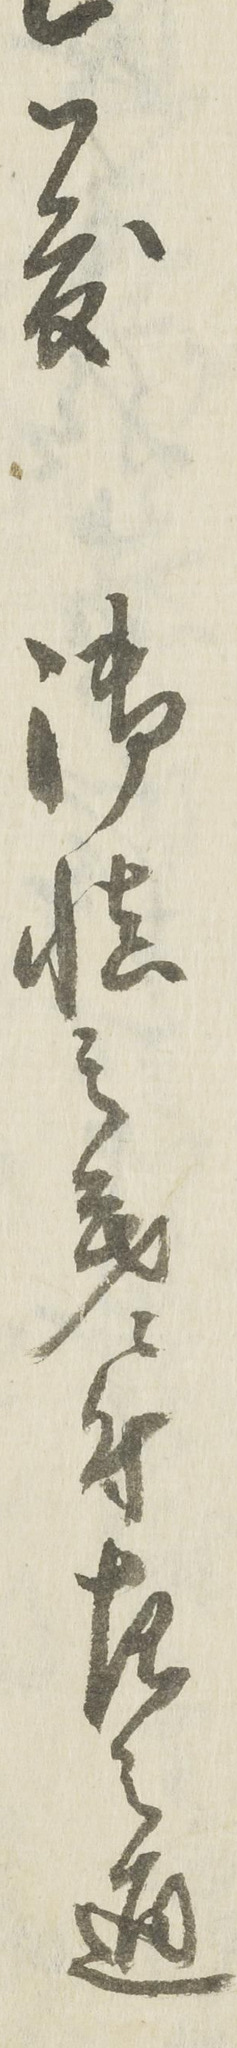今度御慎之義ニ付左之通
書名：後見笑
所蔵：東京大学地震研究所図書室 Earthquake Research Institute Library, The University of Tokyo, JAPAN
